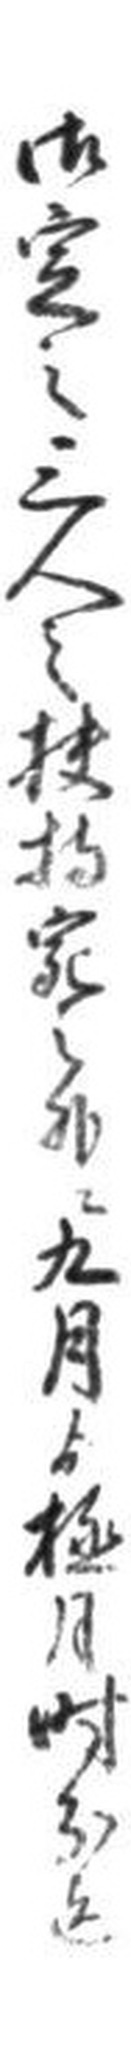御定之三人之扶持宛之外ニ九月ゟ極月時分迄
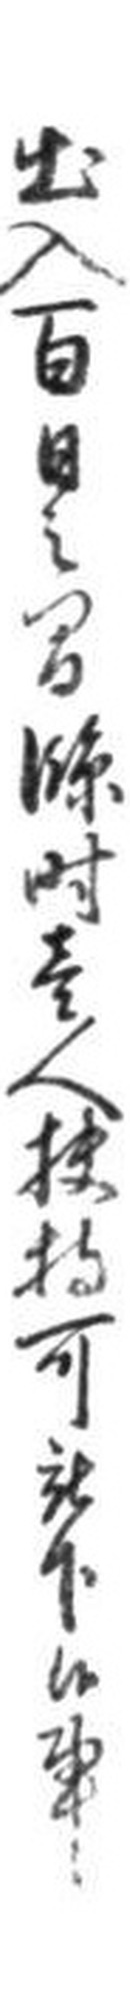出入百日之間臨時壱人扶持可被下候事
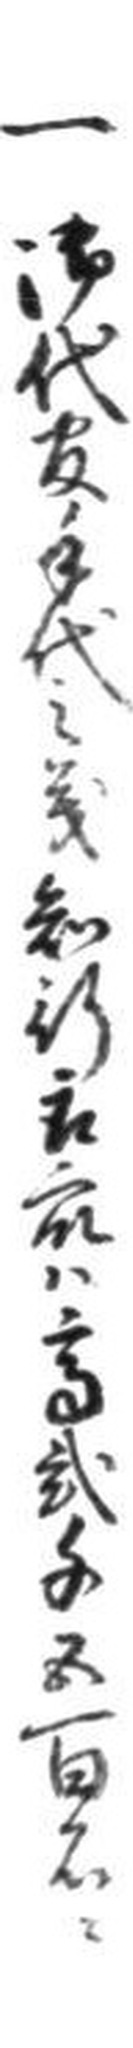一御代官手代之義知行取衆は高弐千五百石ニ
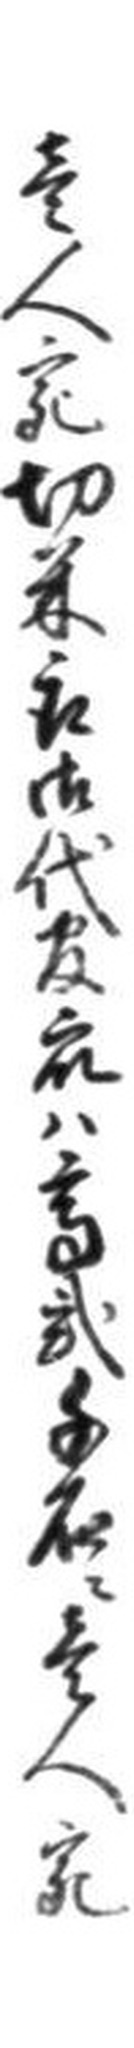壱人宛切米取御代官衆は高弐千石ニ壱人宛
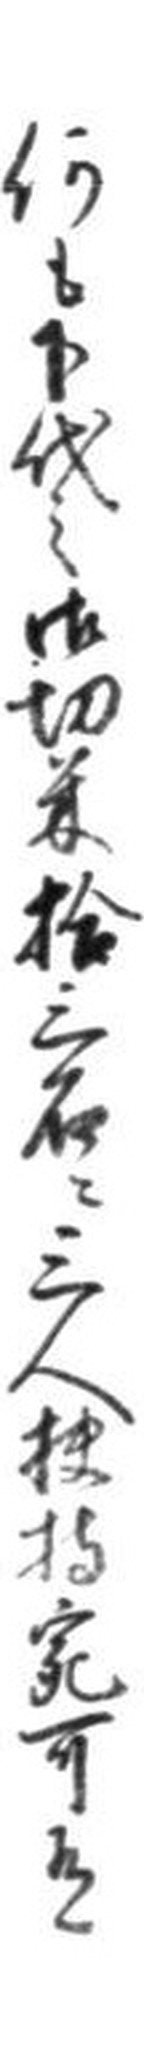何も下代之御切米拾三石ニ三人扶持宛可有
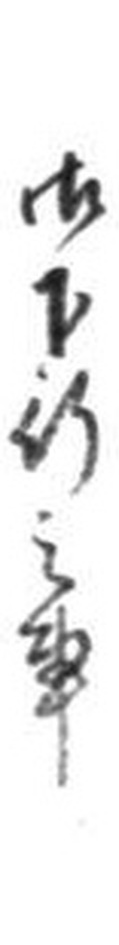御下行之事
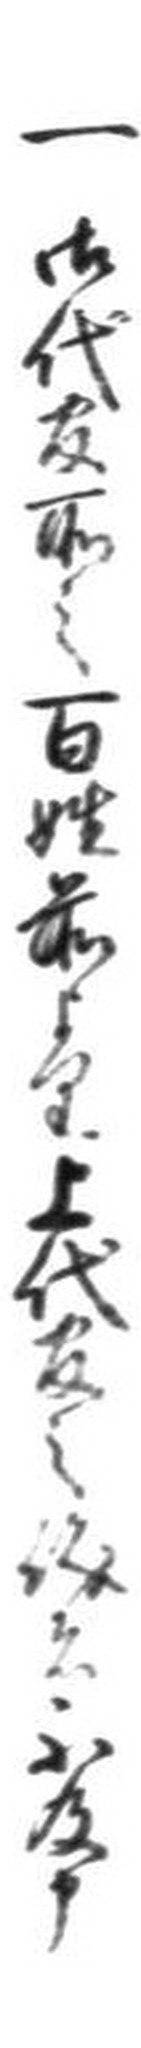一御代官所之百姓前より上代官之儀は不及申
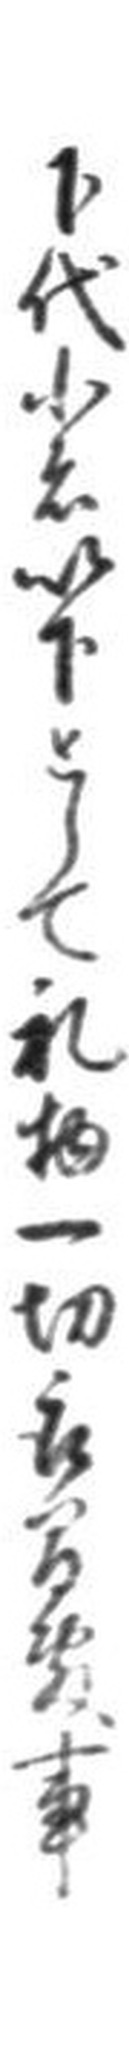下代小者以下として礼物一切取間敷事
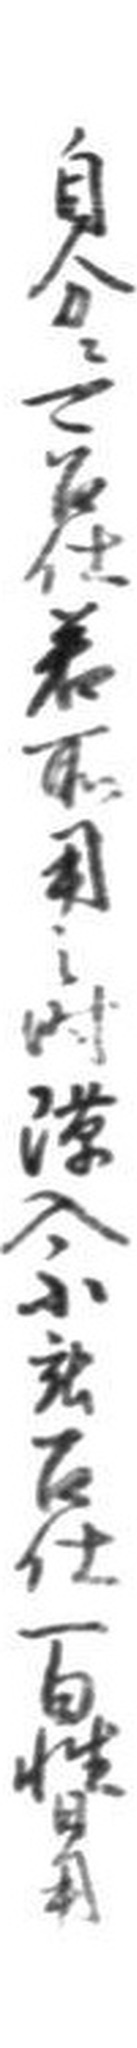自分ニ可召仕若所用之時隙入不被召仕百姓日用
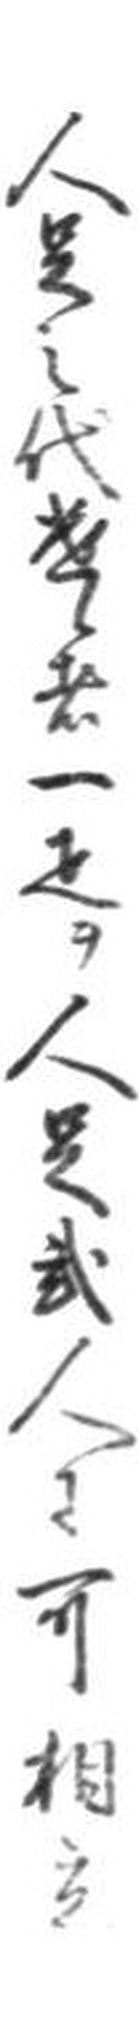人足之代遣候者一疋ヲ人足弐人に可相立
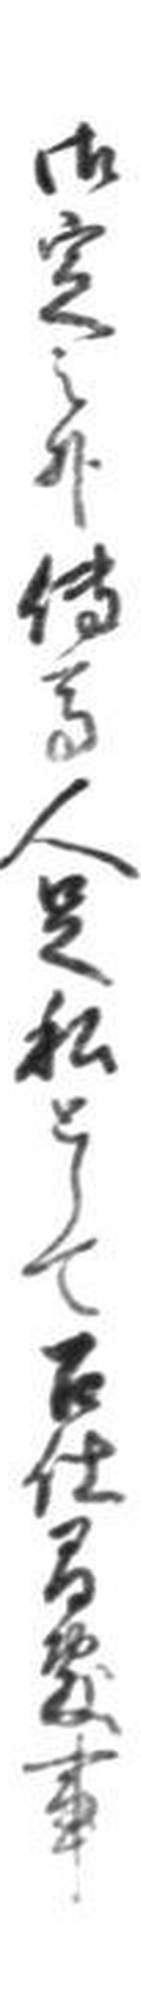御定之外伝馬人足私として召仕間敷事
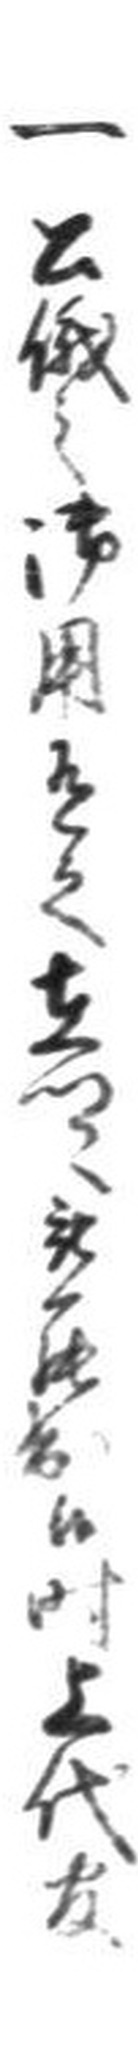一公儀之御用有之在郷へ被罷出候時上代官

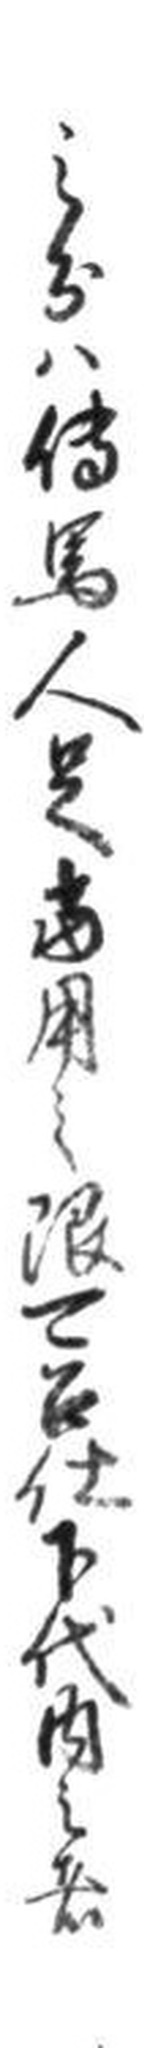之分は伝馬人足当用之限可召仕下代内之者
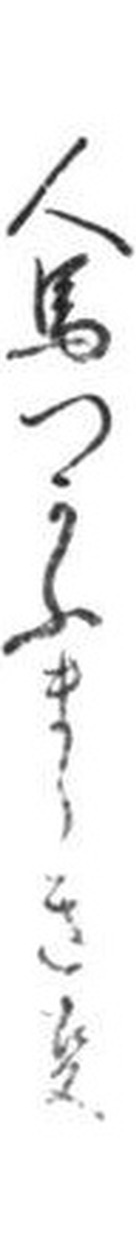人馬つかふましき事
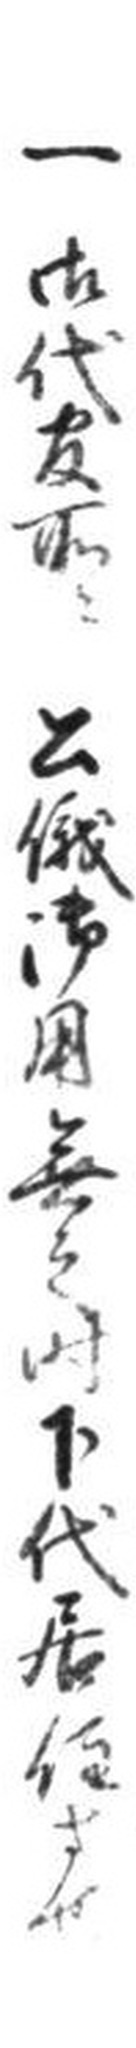一御代官所ニ公儀御用無之時下代居住させ
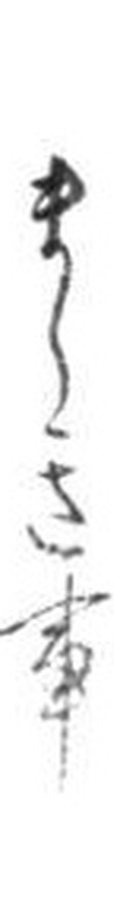ましき事
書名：家譜 三 忠昌公 従慶長八年到寛永六年
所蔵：福井県文書館 Fukui Prefectural Archives
